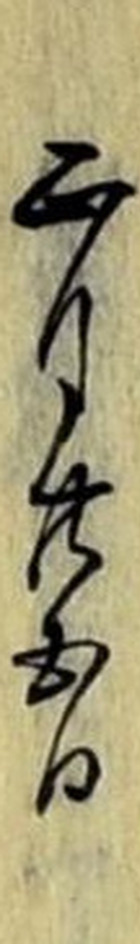正月廿五日
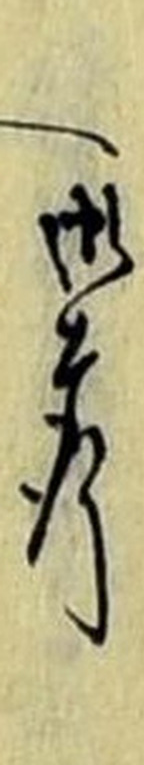御奉行
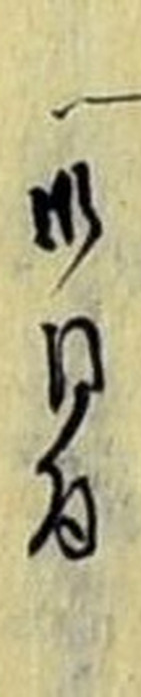御目付
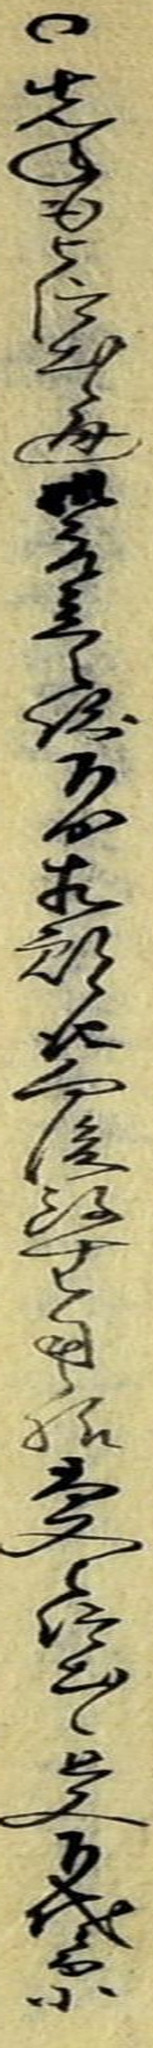〇先年も被仰出候通御取立之儀下ゟ相願候儀向後致無用候様尚又被仰出候且又下代ニ而小
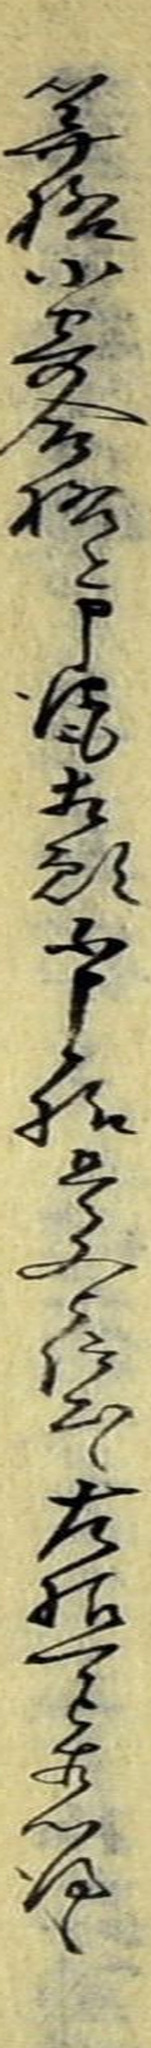算格小寄合格と申儀も相願不申候様是又被仰出候左様可被相心得候
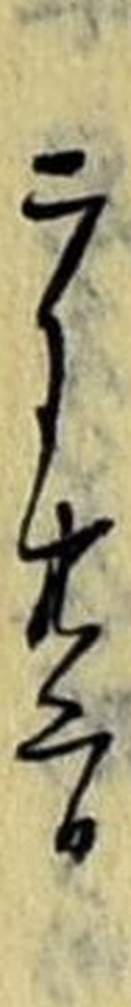二月廿二日

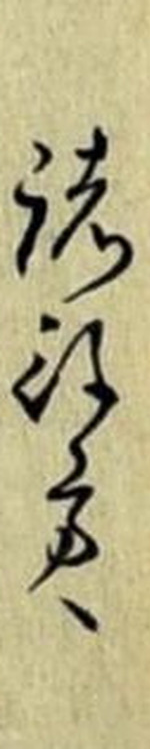諸役方へ
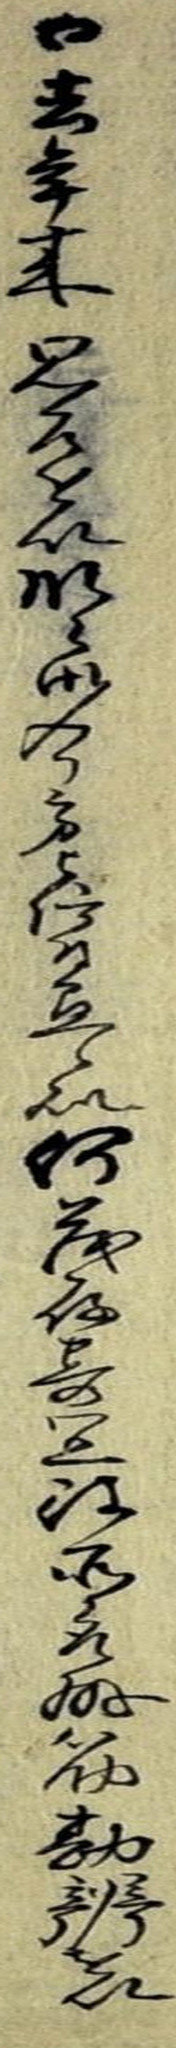〇去年来思召を以段々御〆り方被仰付置候処何茂存寄宜役所取扱筋勘弁を以
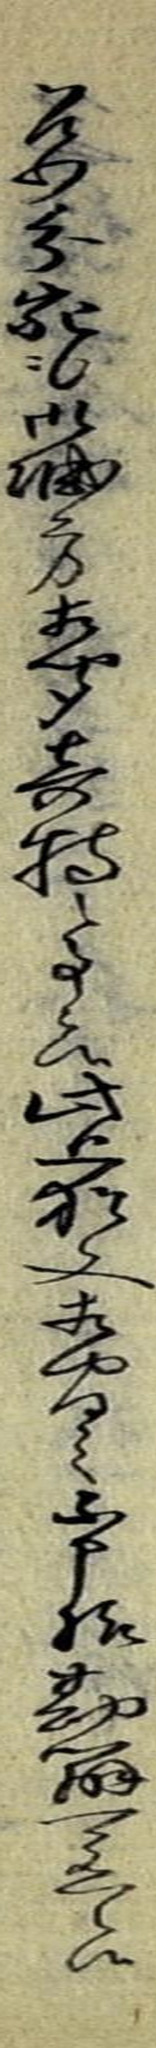乍少分宛も御減方相聞奇特之事ニ候此上猶又相ゆるみ不申様勘弁可有之候
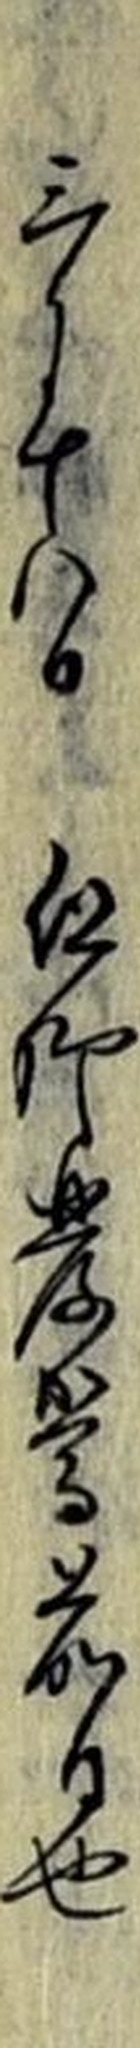三月十八日但御発駕前日也
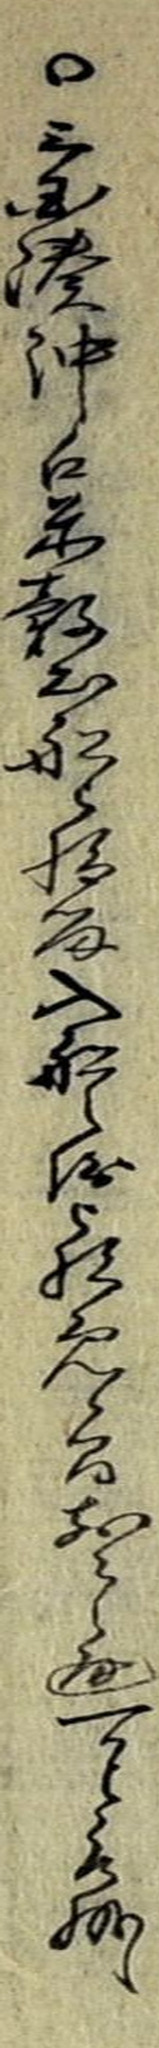〇三国湊沖之口米穀出船被指留入船之儀被指免候間前々之通可被取扱候
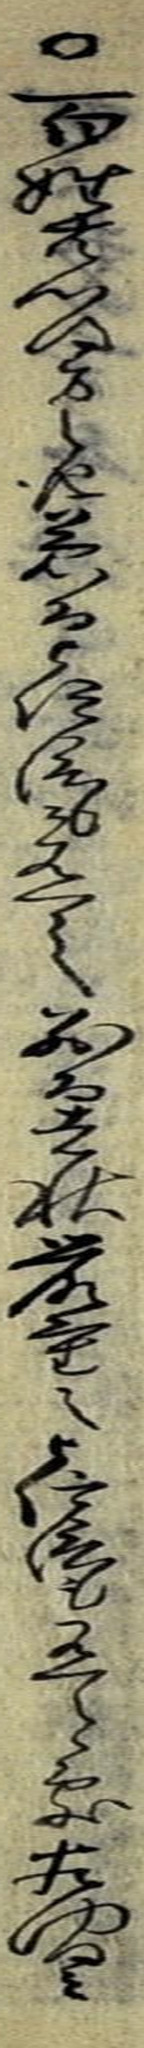〇百姓共心得方之儀兼而被仰渡も有之別而去秋厳重之被仰渡も有之候処相ゆるみ
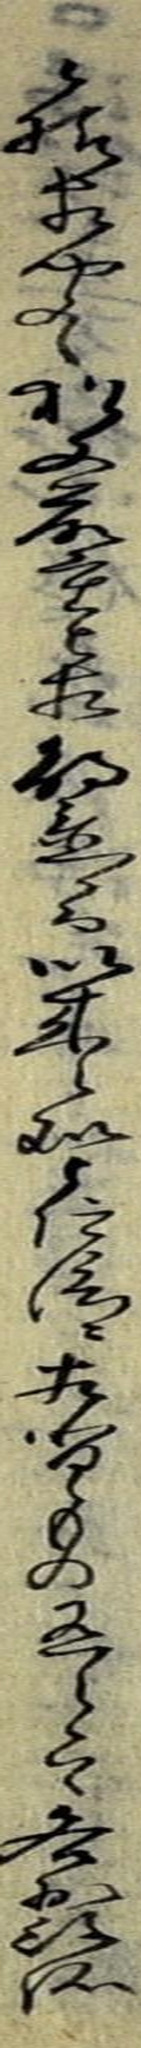候様相聞候猶又厳重被相触置候而以来之処被仰渡ニ相背候もの有之候ハヽ各於役所
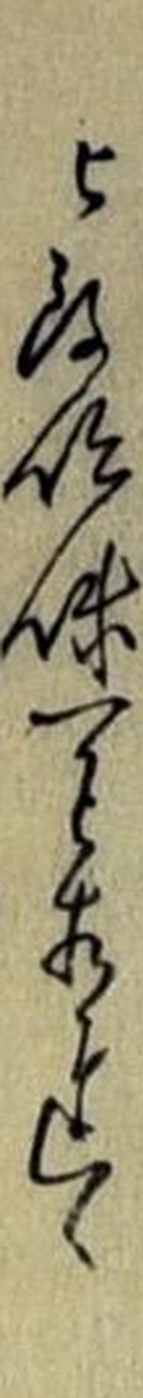被致吟味可被相達候
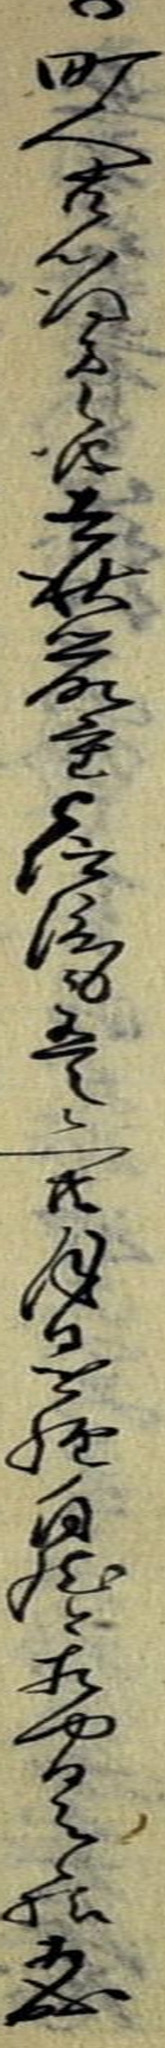〇町人共心得方之儀去秋厳重被仰渡も有之候へ共月日を経自然と相ゆるみ候様相成
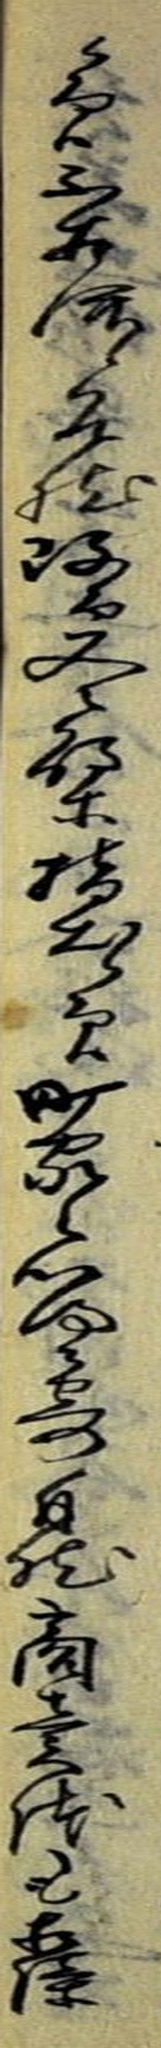候而ハ不相済候乍然改而又々触等指出候而ハ町家之心得ニ寄自然商売体へも相障
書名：命令之部 三
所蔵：福井県文書館 Fukui Prefectural Archives
